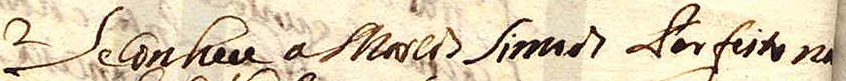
2 Se conhece a Marcos Simoes Perfeito na
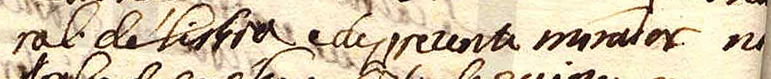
ral de Lisboa, e de prezente morador na
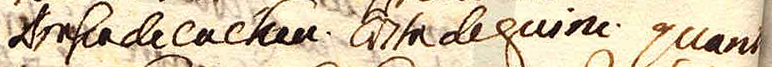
Praça de cacheu. Costa de guine quant
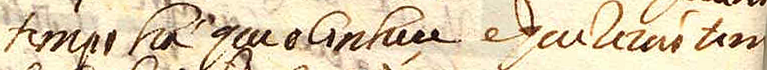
tempo há que o Conhece e que Rezaõ tem
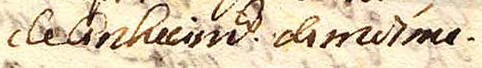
de conhecim.to do mesmo.
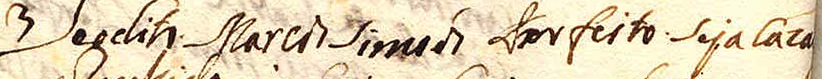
3 Se o dito Marcos simoẽs Perfeito seja caza
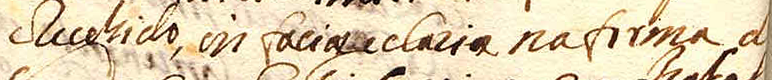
Recebido, in facia eclazia na forma d
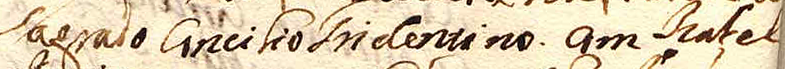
sagrado Concilio tridentino. com Izabel
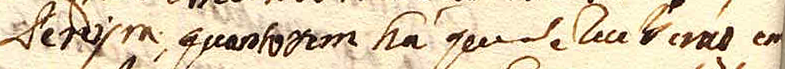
Pereyra, quanto tem há que se Receberaõ em
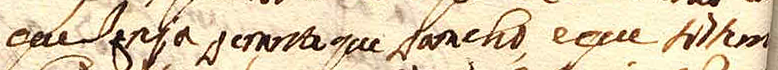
que Igreja perante que Paracho, e que testem
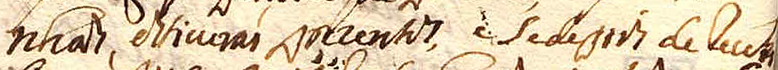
nhas, estiueraõ prezentes, e se depois de Receb
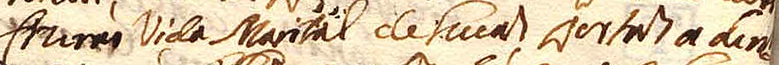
fizeraõ Vida Marital de huās portas aden
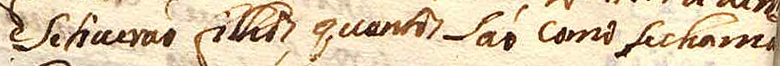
Se tiuerão filhos, quantos Saõ como se chama
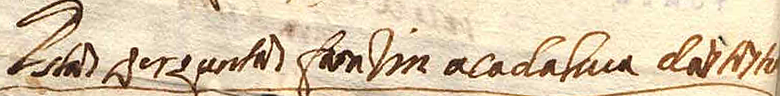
Estas perguntas fara Vm a cada hua das test
